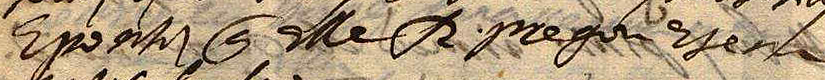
E pontos q̄ Elle R. pregou E tem
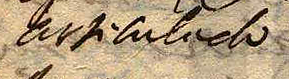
articulado.
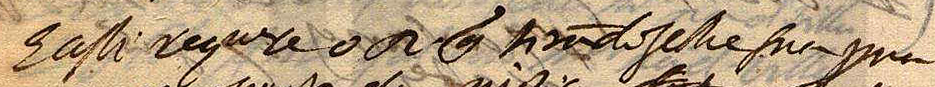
E assi requere o R. q̄ tirādoselhe sua ꝓua
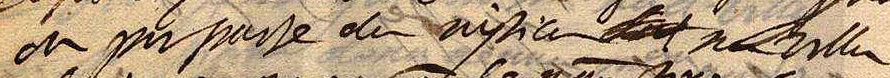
ou por parte da iustiça _ na villa
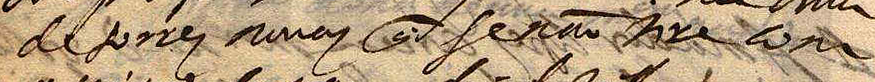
de torres nouas q̄ se não tire com
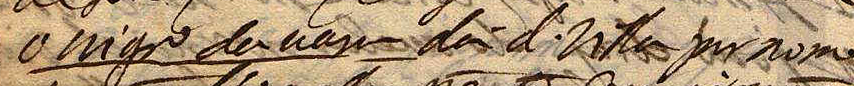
o uigro da uara da d. villa por nome
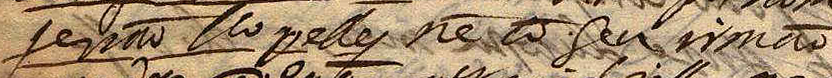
fernão lço velles nē cō seu irmão
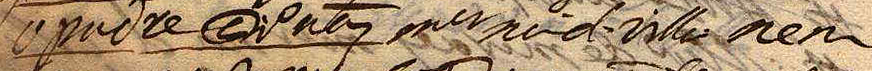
o padre Dio uāz mor na d. villa nem
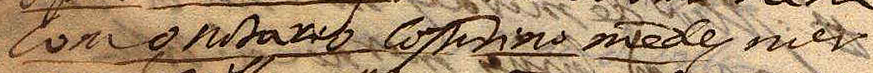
com o notario costātino mēdez mor
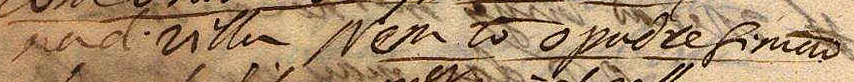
na d. villa Nem cō o padre simão
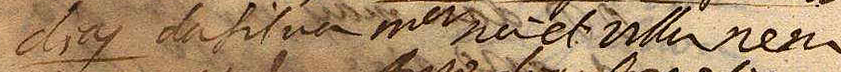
dias da silua mor na d. villa nem
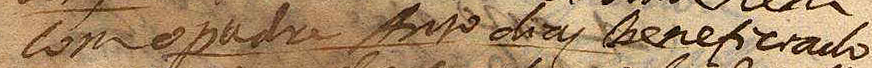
com o padre Anto diaz beneficiado
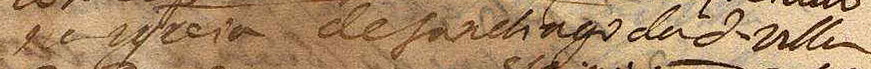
da igreia de sanctiago da d. villa
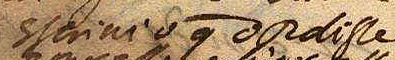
Escriui o q̄ o R disse
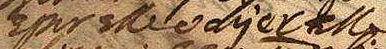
E por Elle o dizer Elle
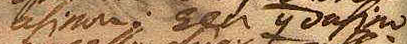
asinou. E eu q̄ o asino
